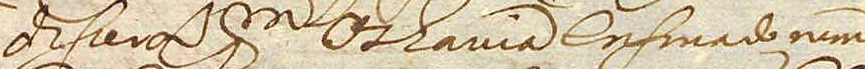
disseraõ qm os hauia Ensinado nem
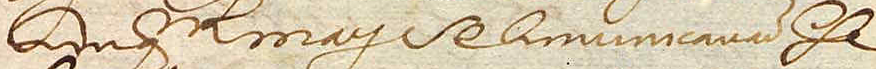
com qm mais se Comunicauaõ E se
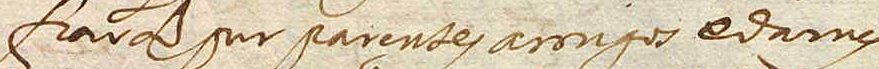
fiaraõ por parentes amigos e da mes
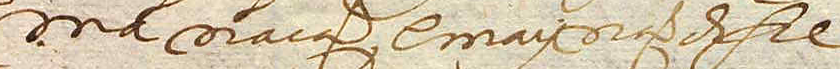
ma nacaõ, e mais naõ disse
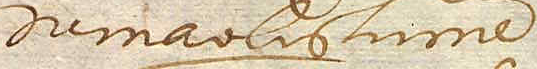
nem ao Custume
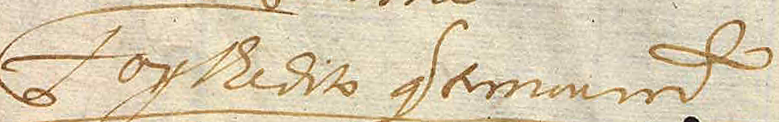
Foy lhe dito q̄ tomou mto
